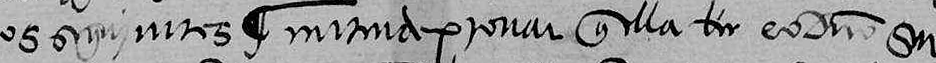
os segujmtes ¶ entende prouar q̄ ella Ree e o Dito seu
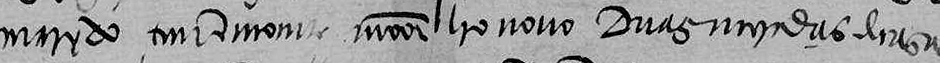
marydo tem ē momtem̄oor ho nouo Duas moradas de casas
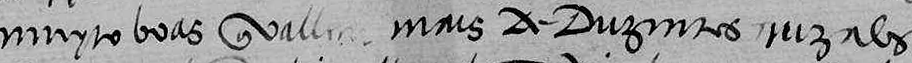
muyto boas q̄ vallem mais de Duzentos cruzados
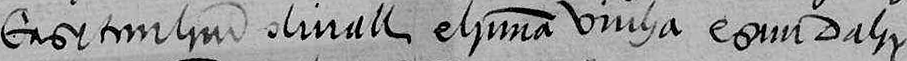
E asy tem hū oliuall e hūua vinha e sam Dahy
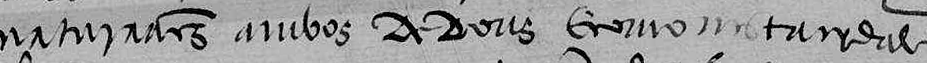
naturaaēs ambos De Dous e como nesta cydade
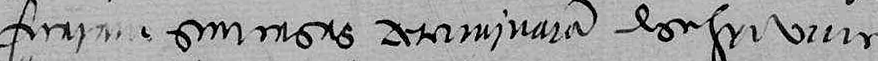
ficaram sem casas Determjnarā de se hyr viuer
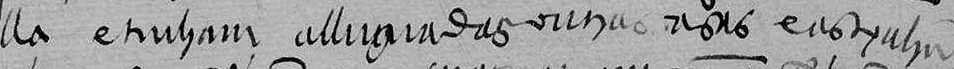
lla e tinham alluguadas outras casas e as tynhā
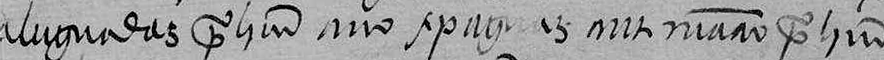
aluguadas p̄o hū ano e paguas antemãao p̄o hū
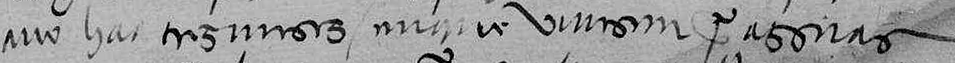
ano ha tres meses / em que viuesem p̄o assi as
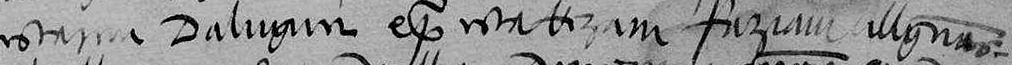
estarem Daluguer e p̄o esta Rezam faziam allgūas
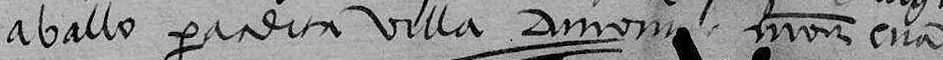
aballo ꝑ a dita villa De momte mor e nā
